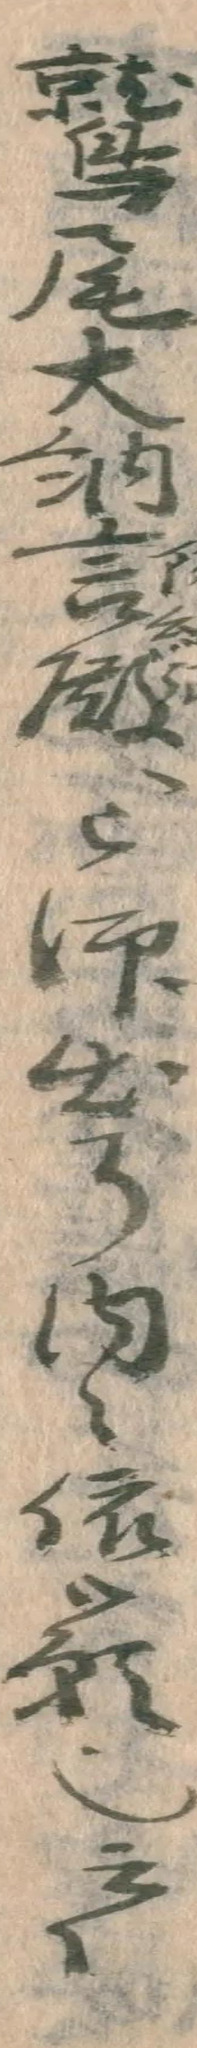鷲尾大納言殿へ被仰出了、内々依御願也云々、
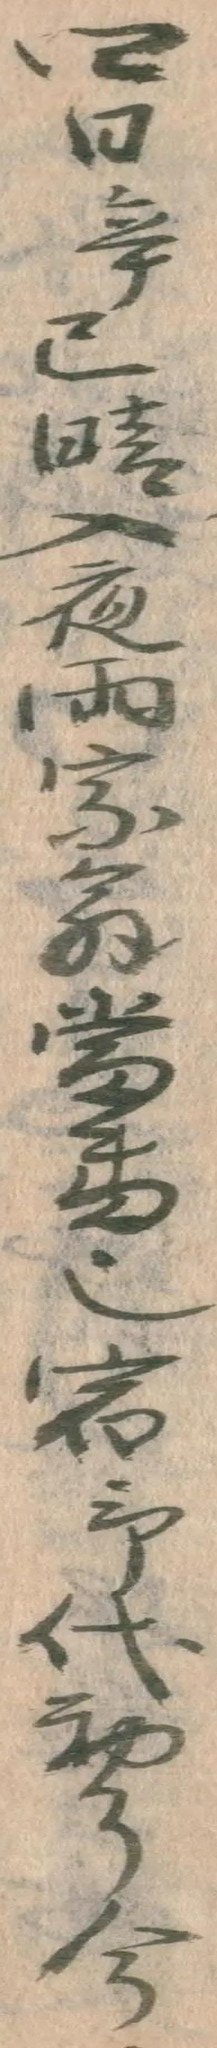四日辛巳晴入夜雨、家翁番也、宿予代勤了、今
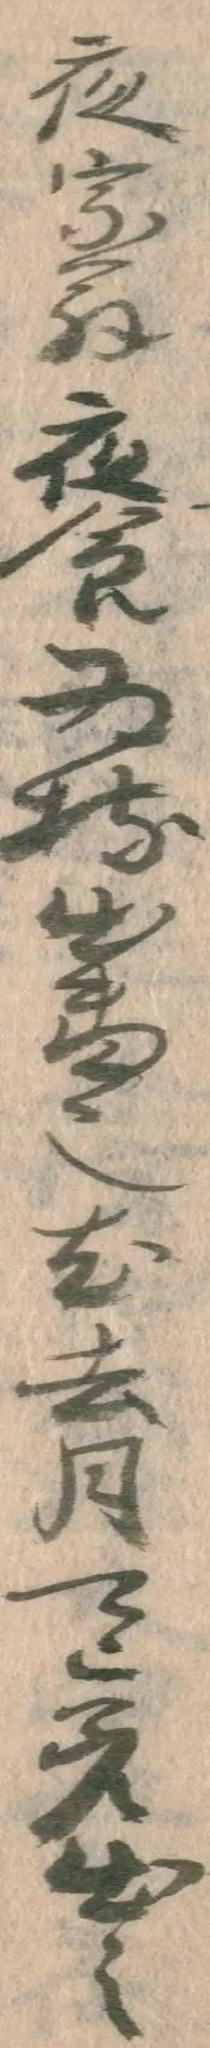夜家翁夜食為持出番也、尤去月可被差出之
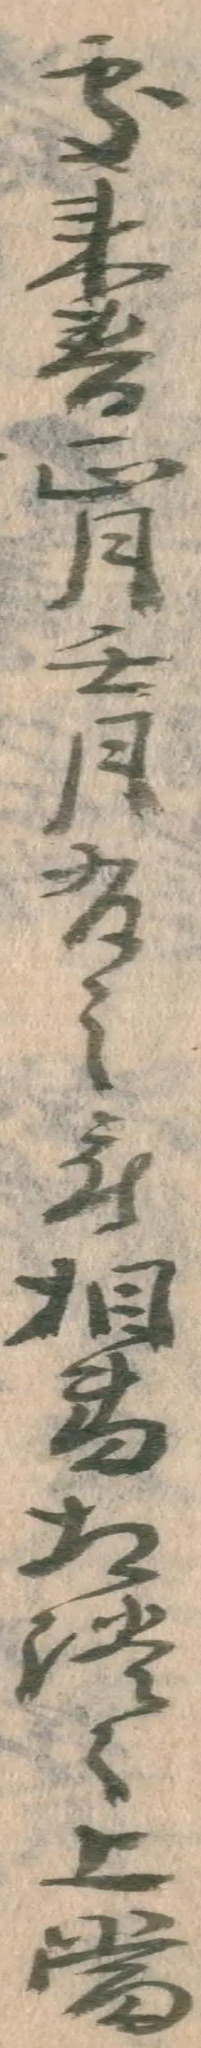處、来春正月壬月有之ニ付、相番相談之上當
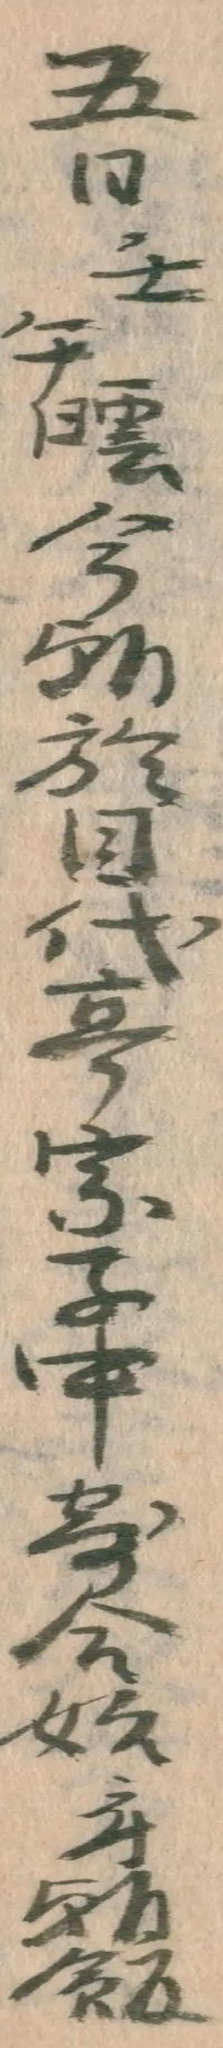五日壬申曇、今朝於目代亭家子中寄合始ニ付朝飯
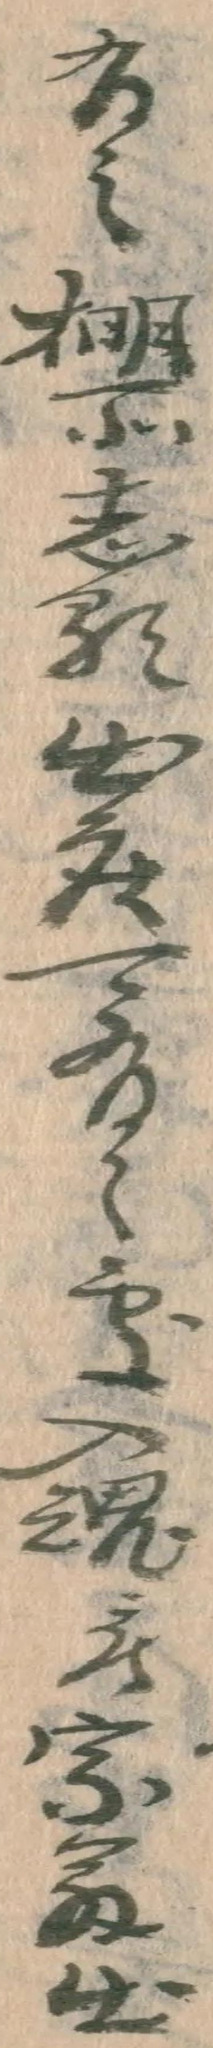有之、棚所志顕出座可有之處、入魂ニ付家翁出
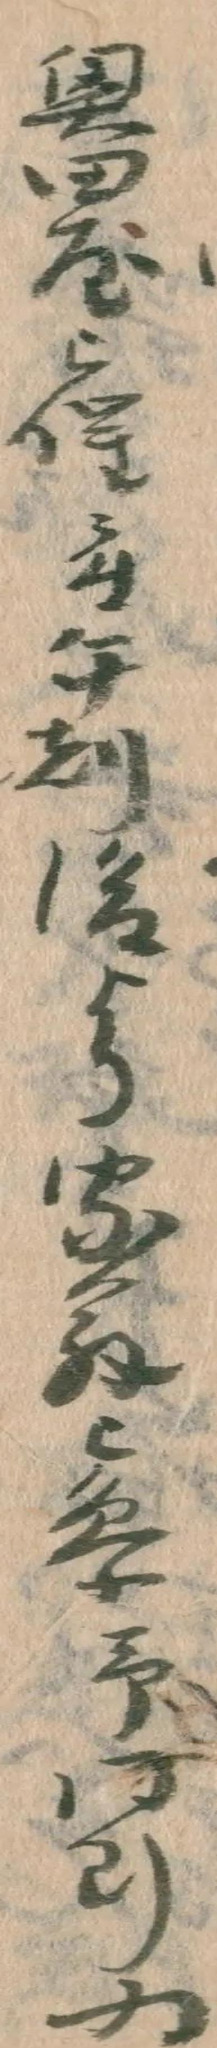奥田屋被催ニ付、午刻後より家翁被参、予同断、為
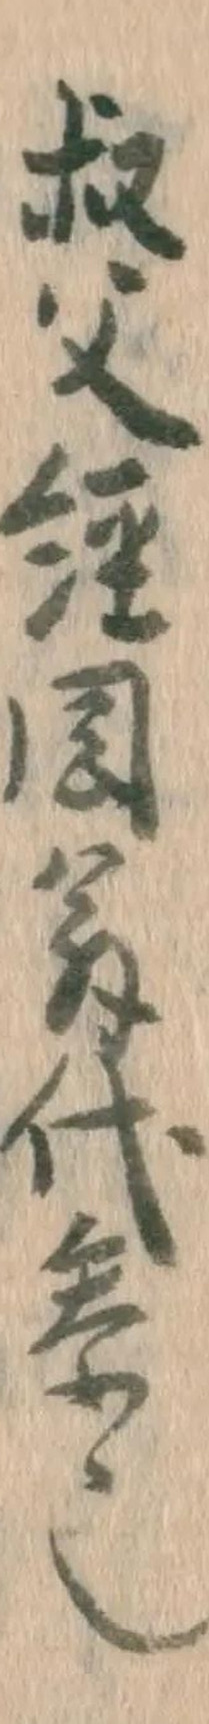叔父経岡翁代参也、
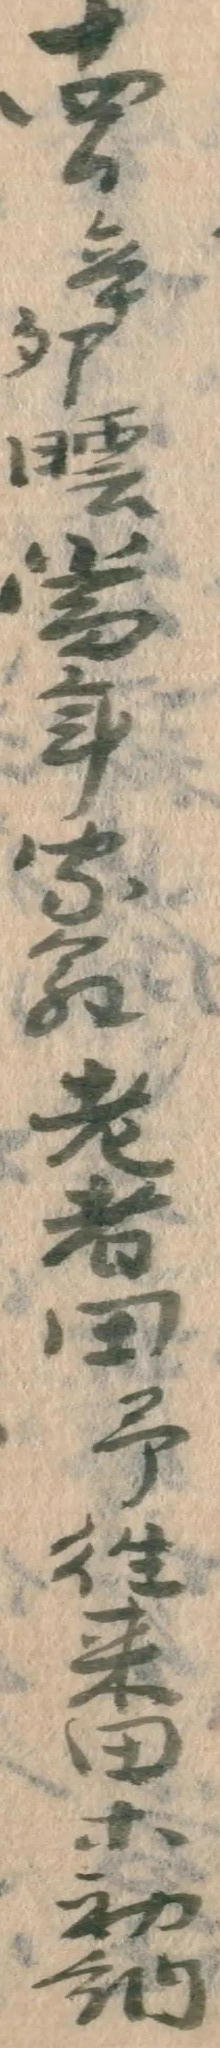十四日辛巳曇、當年家翁老者田・予往来田等初納
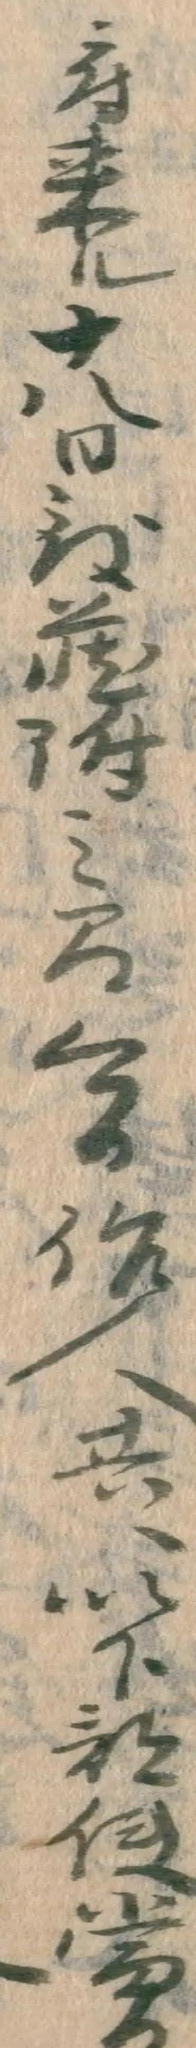ニ付、来ル十八日致蔵附之間、今日作人共へ以下部使當日
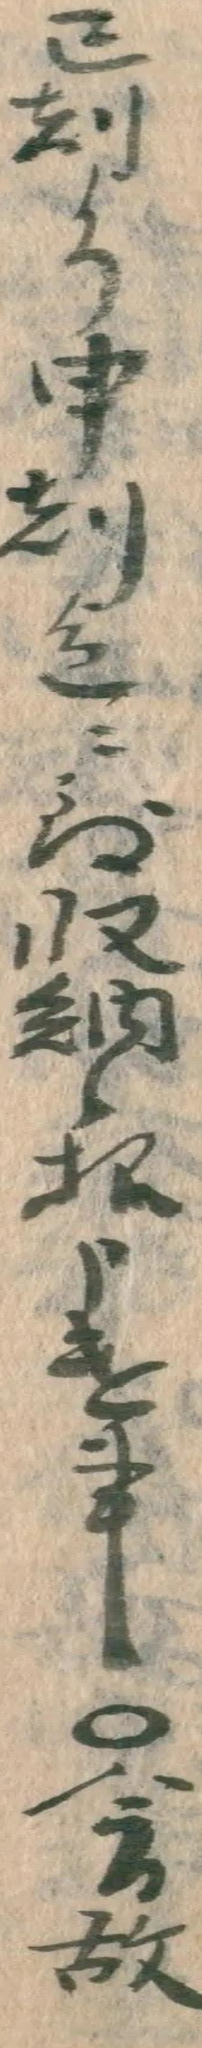巳刻より申刻迄に致収納候様申遣事、○今日故
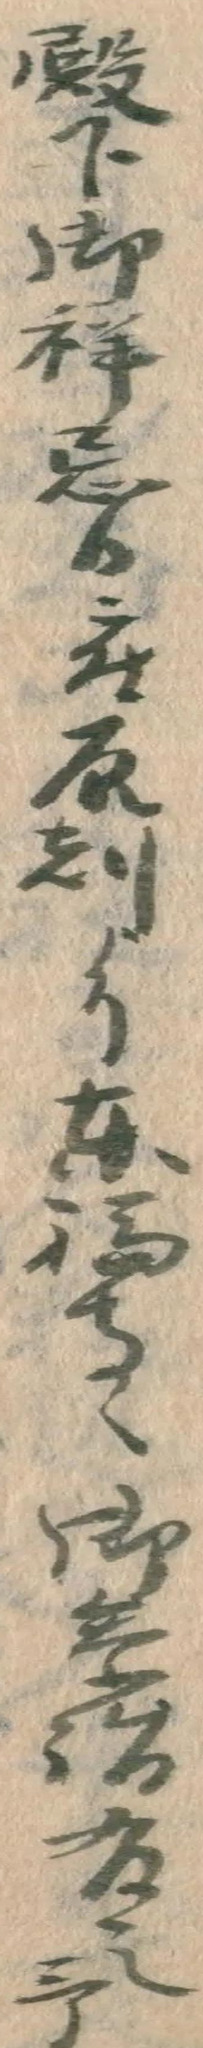殿下御拝忌日ニ付、辰刻より東福寺へ御参詣有之、予
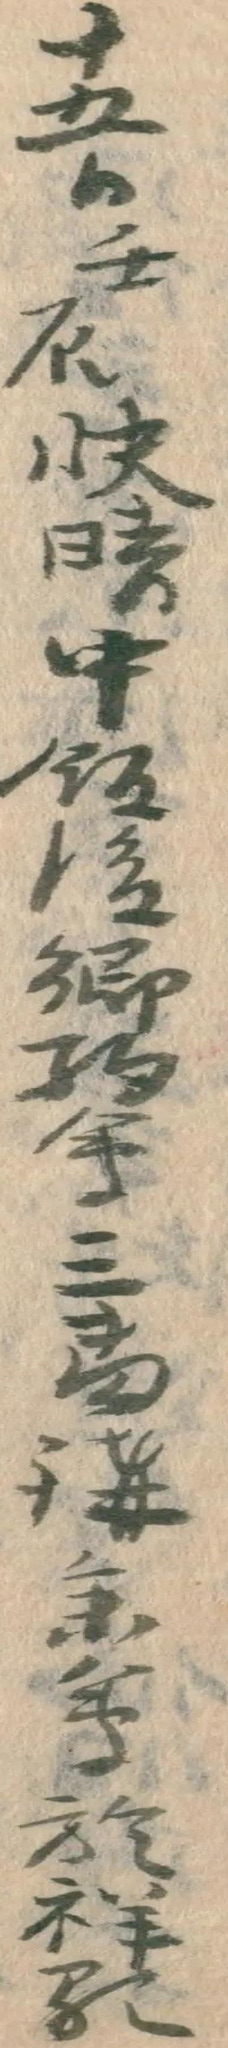十五日壬辰快晴、中飯後郷持會、三番講参會、於祥顕
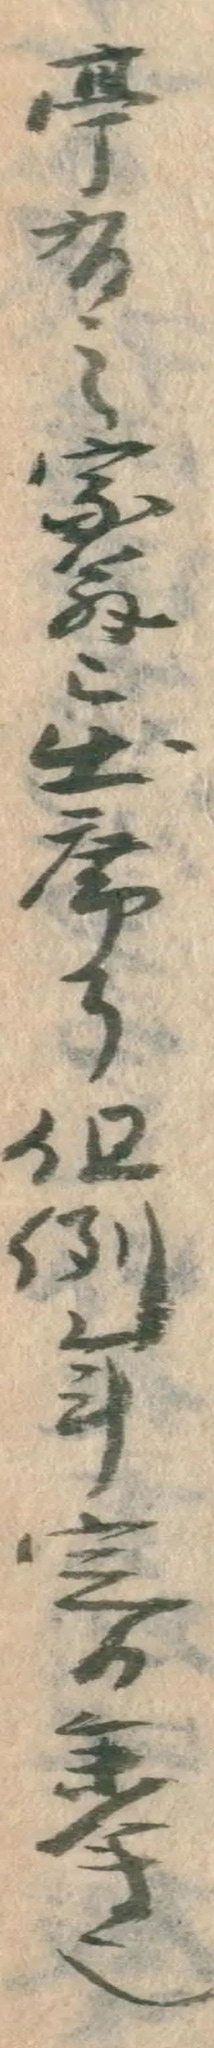亭有之、家翁被出席了、但例年定日参會也、

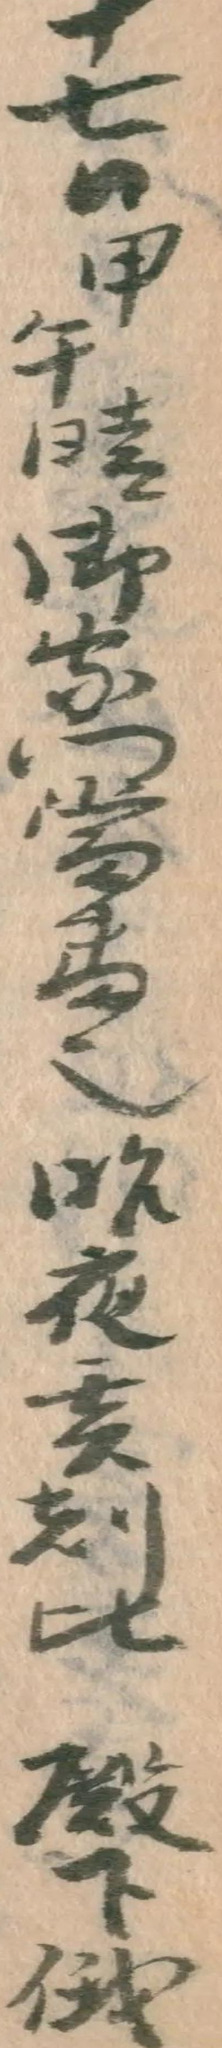十七日甲午晴、御家門當番也、昨夜亥刻頃殿下俄
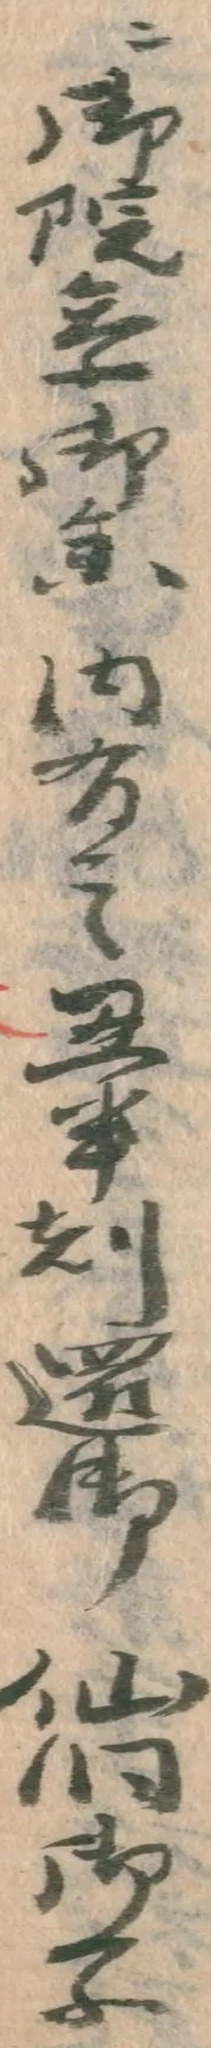ニ御院参御参内有之、丑半刻還御、仙洞御子
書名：賀茂社記録. 第63冊
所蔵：国立国会図書館 National Diet Library, JAPAN
